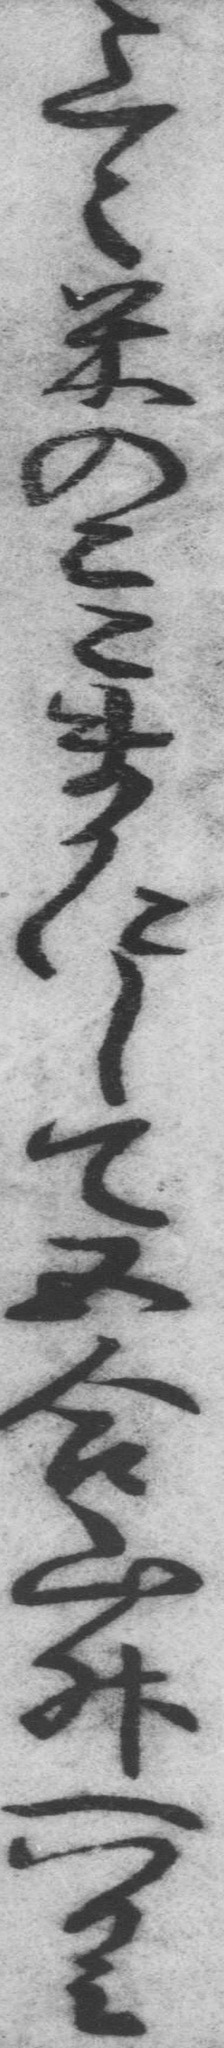上々米のここまかにして五合山椒へいるみ
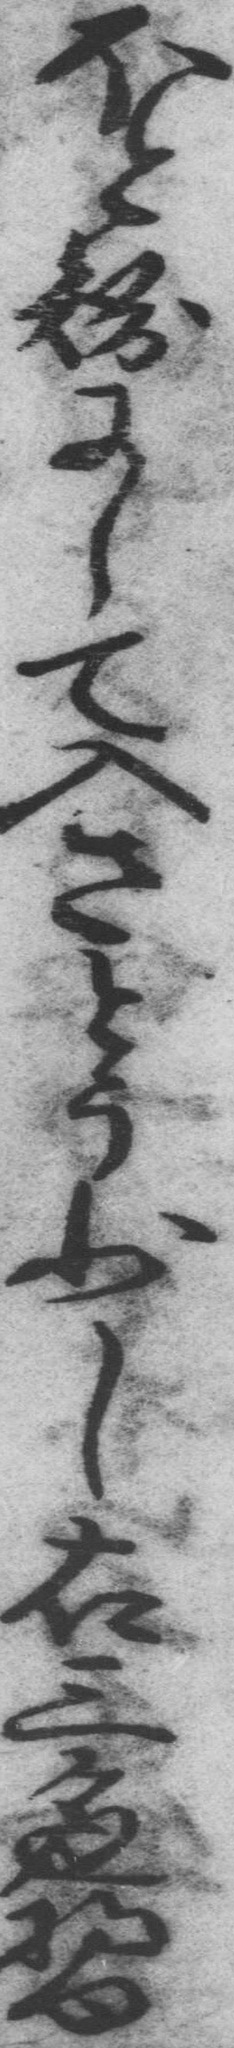ほと粉にして入さとう少し右三色醤
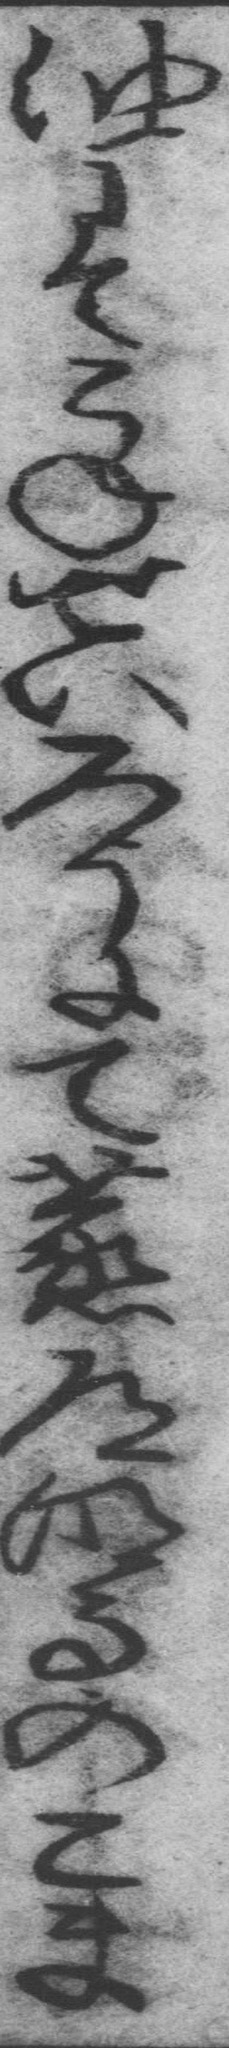油にてこねせいろうにて蒸道明寺のこま

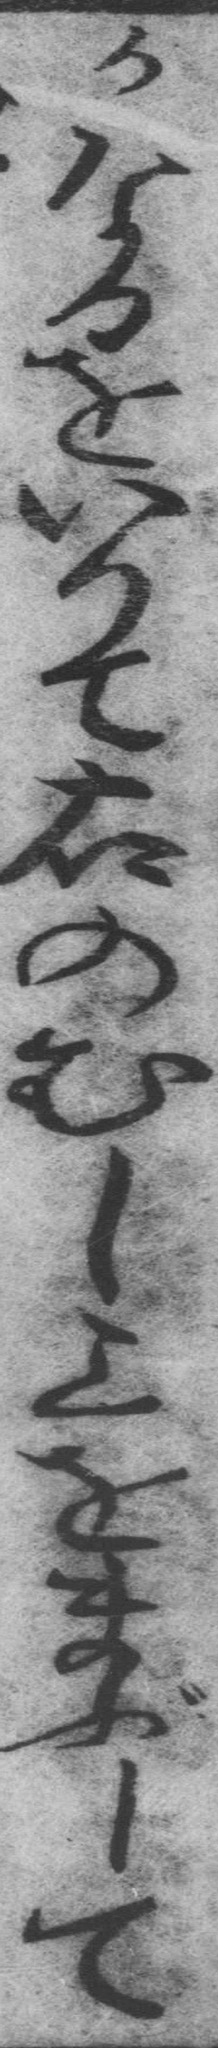かなるをいりて右のむし上をまぶして
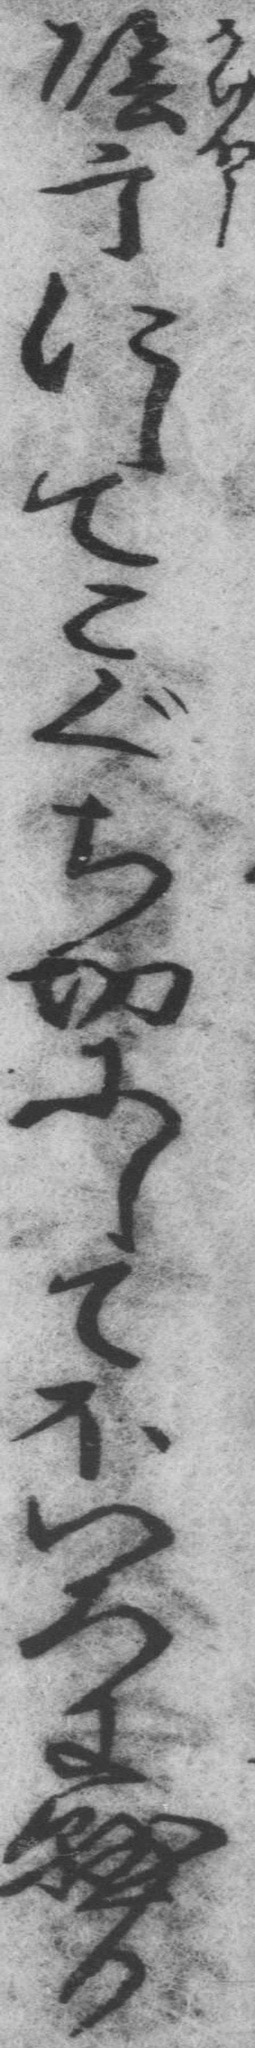陰干にしてこぐち切にしてほいろに懸る
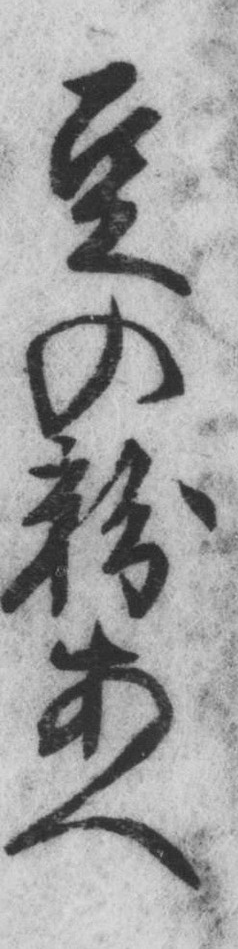豆の粉あへ
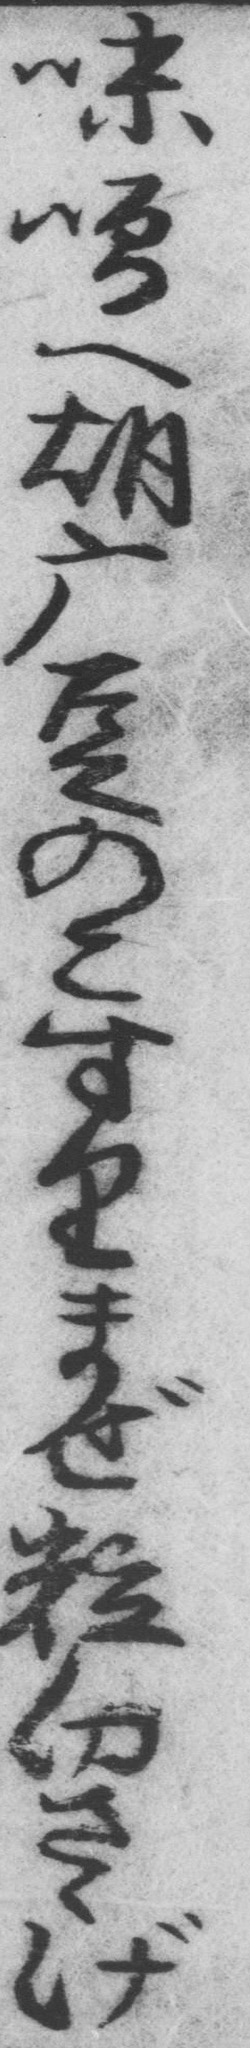味噌へ胡麻豆のこすりまぜ粒白さゝげ
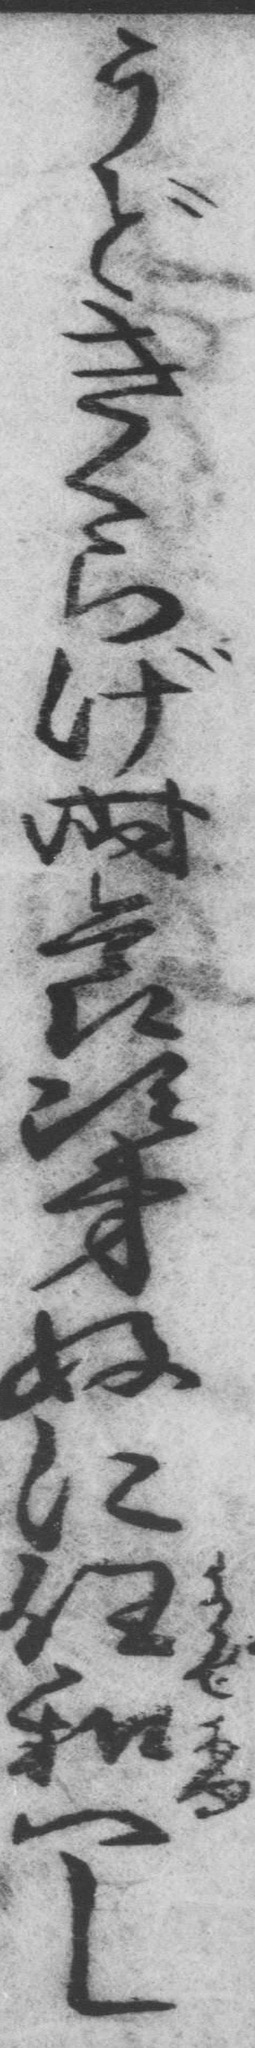うどきくらげ時節次第好に任和へし
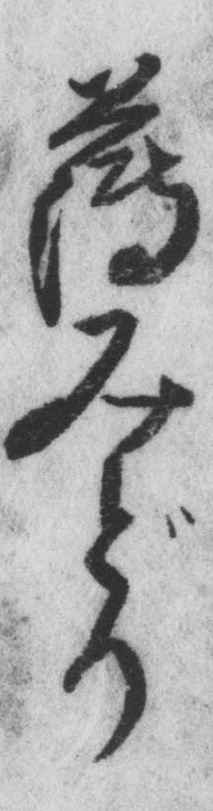薄みどり
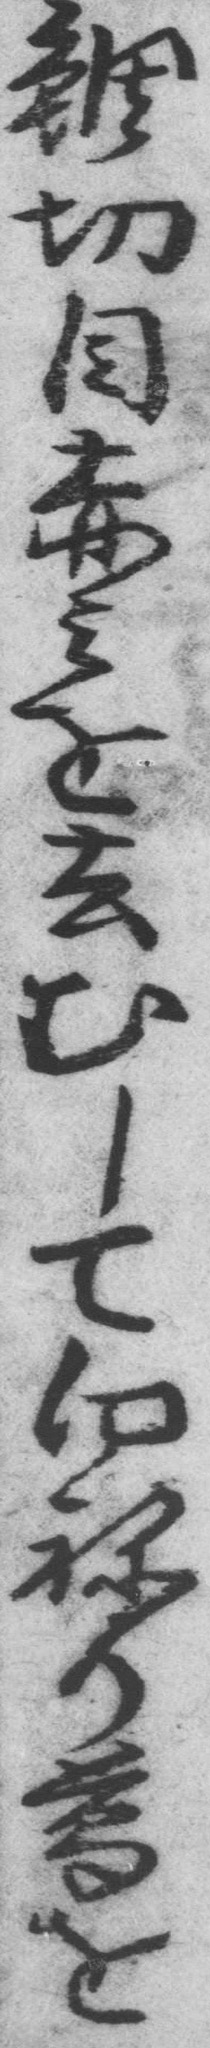鯛切目赤みを去むして白ねり葛を
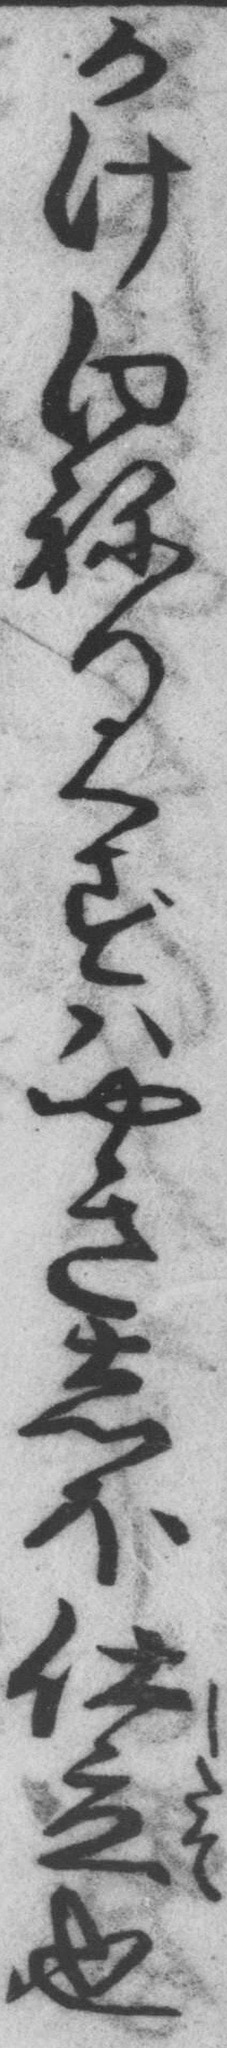かけ白ねりくずはやきしほ仕立也
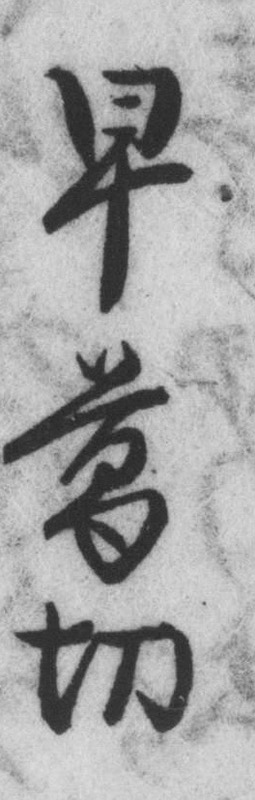早葛切
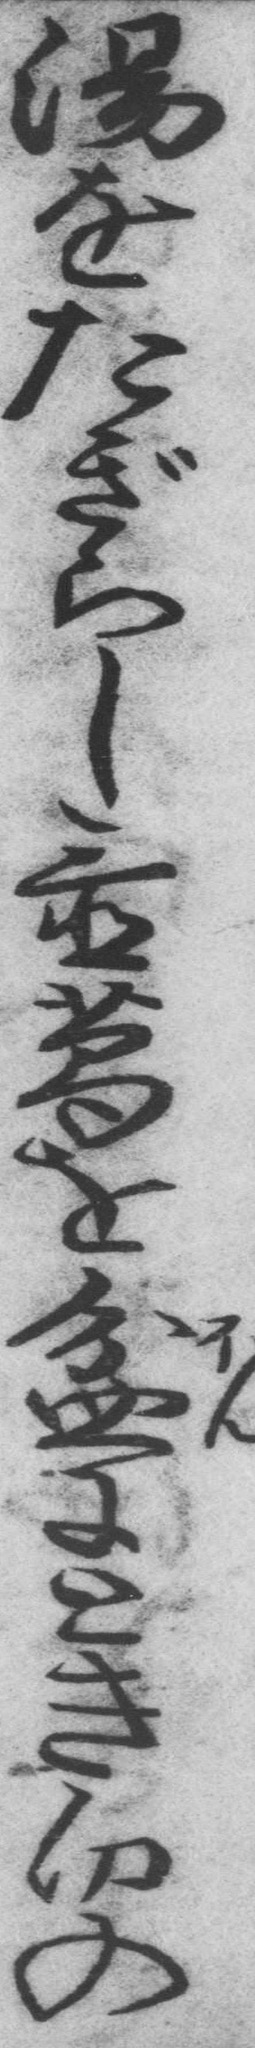湯をたぎらし置葛を盆にとき白の
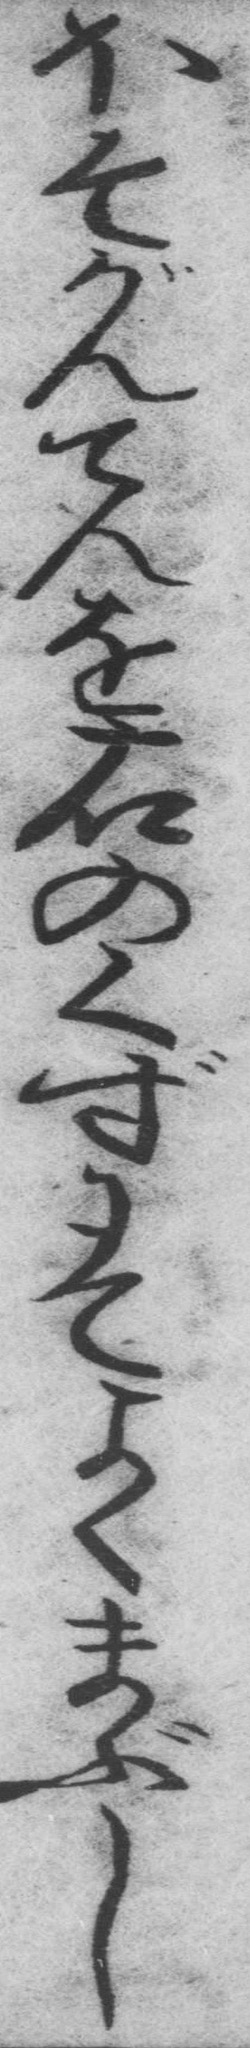ほそがんてんを右のくずにてよくまぶし
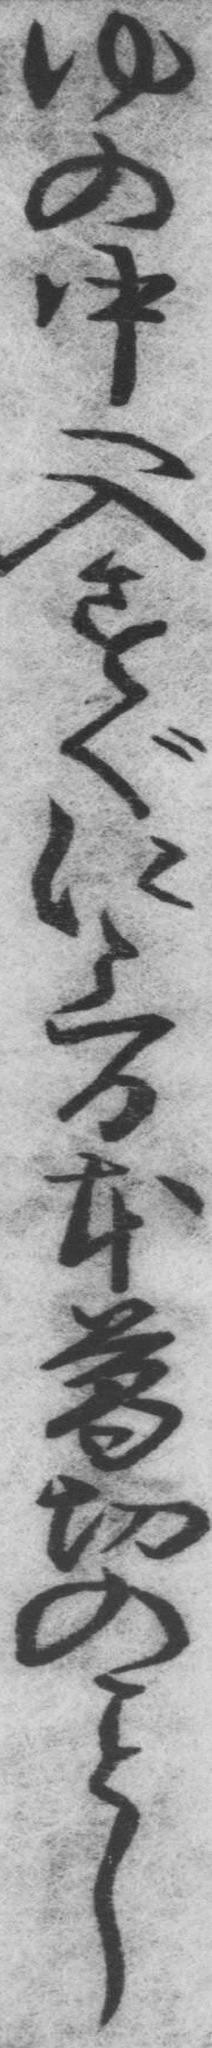ゆの中へ入すぐに上る本葛切のことし
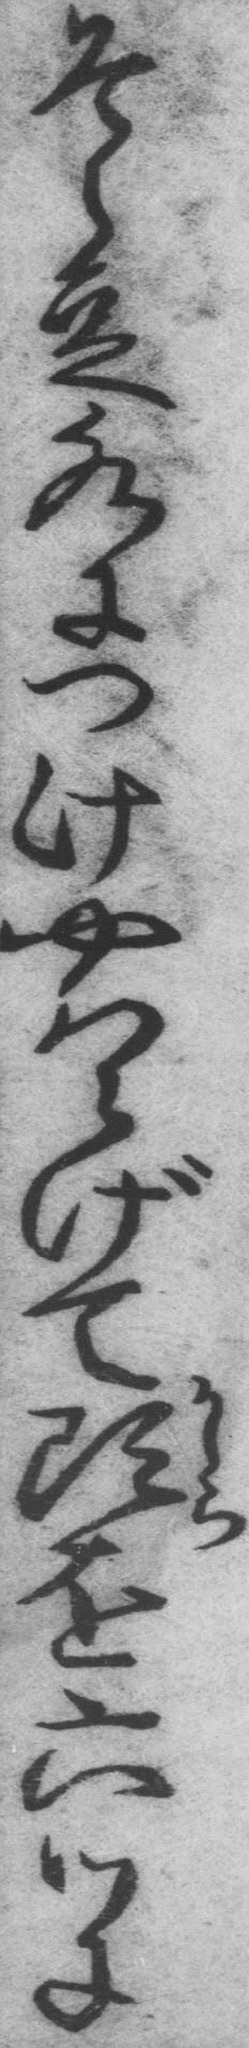そら豆水につけやはらげて頭を六ツに
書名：料理山海郷
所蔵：大阪府立大学学術情報センター 国文学研究資料館
